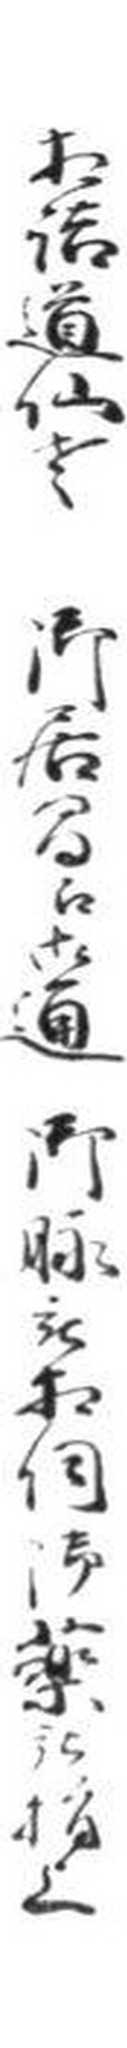相詰道仙老御居間江御通御脈被相伺御薬被指上
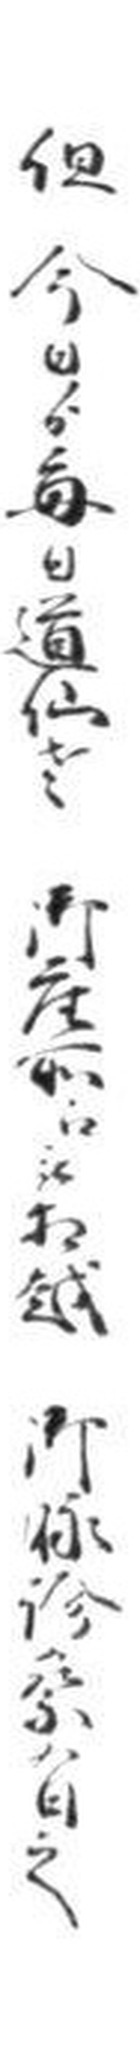但今日ゟ毎日道仙老御座所江被相越御脈診察有之
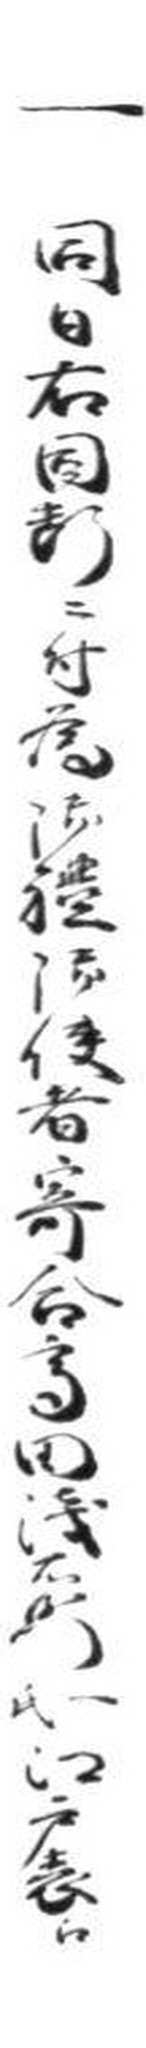一同日右同断ニ付為御礼御使者寄合高田浅右衛門一氏江戸表江
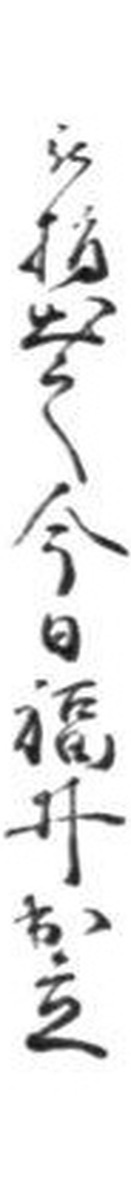被指出之今日福井出立
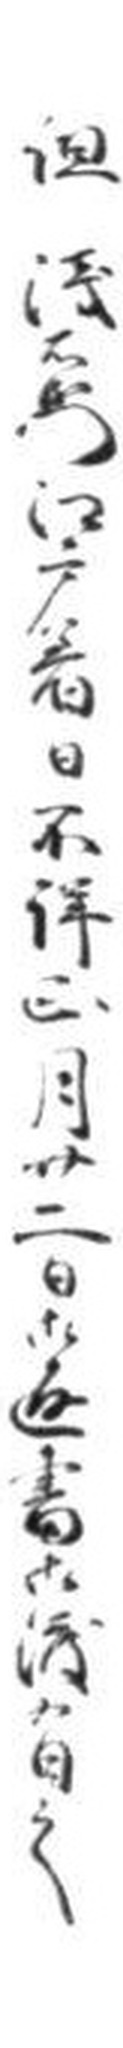但浅右衛門江戸着日不詳正月廿二日御返書御渡有之
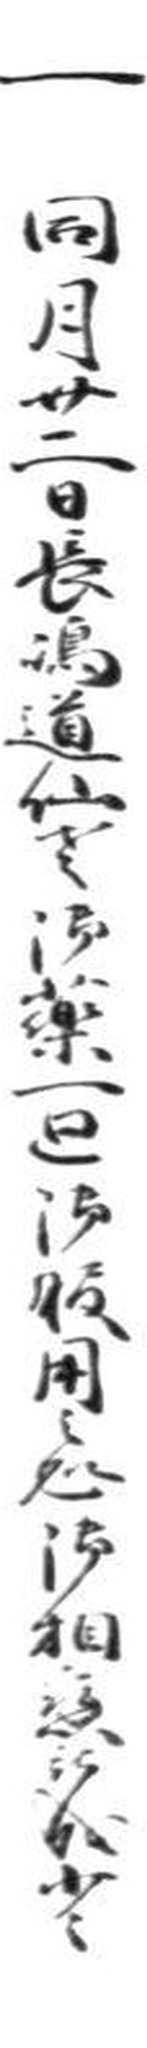一同月廿二日長嶋道仙老御薬一廻御服用之処御相応被成少々
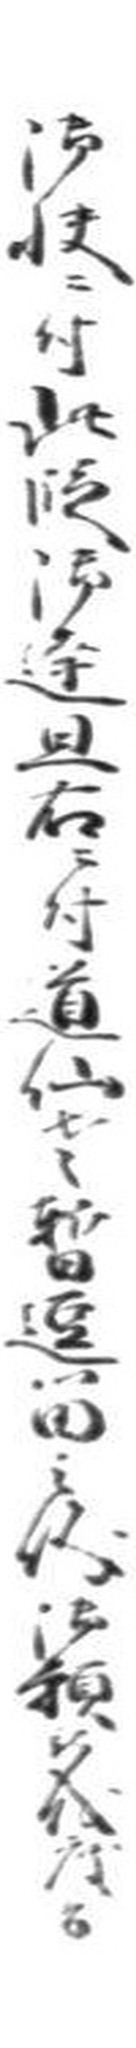御快ニ付此段御達且右ニ付道仙老暫逗留之儀御願被成度旨
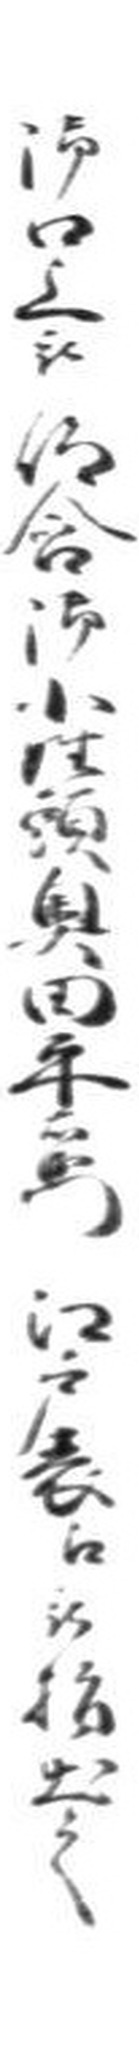御口上被仰含御小姓頭奥田平右衛門江戸表江被指出之
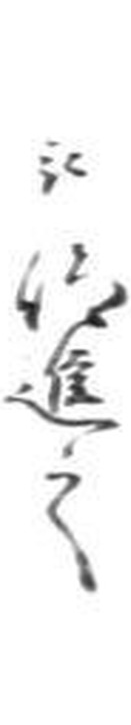被仰進之
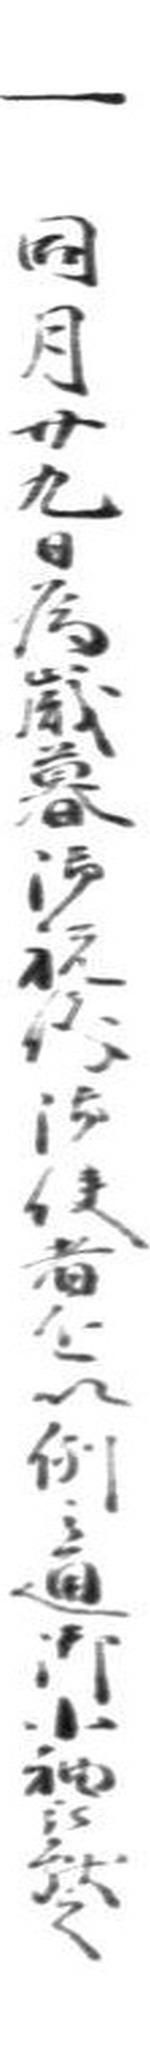一同月廿九日為歳暮御祝儀御使者を以例之通御小袖被献之
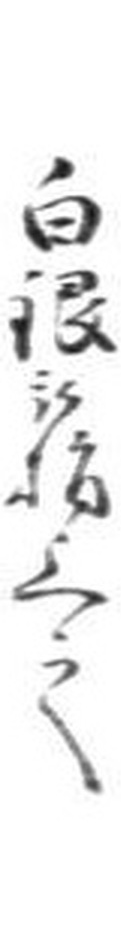白銀被指上之
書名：家譜 十七 吉品公 従元禄元年到同二年
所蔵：福井県文書館 Fukui Prefectural Archives
